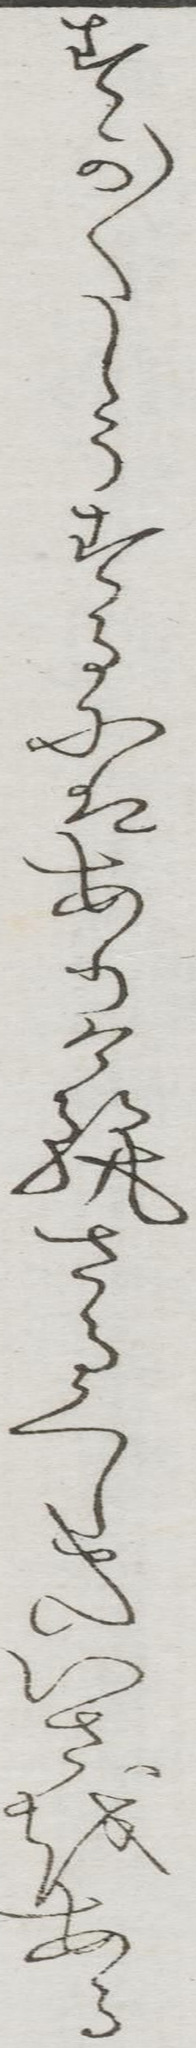すか〳〵しうするにはありけれさるくしきいさをある
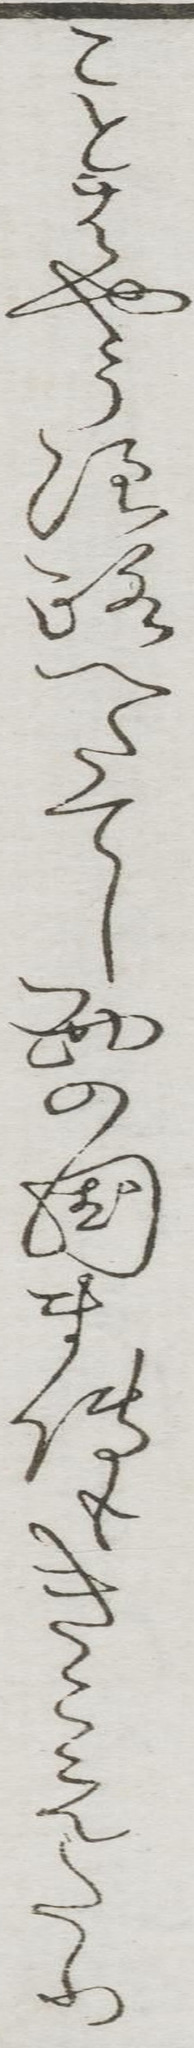ことはやう浪路へたてし西の国まてもきこえたり
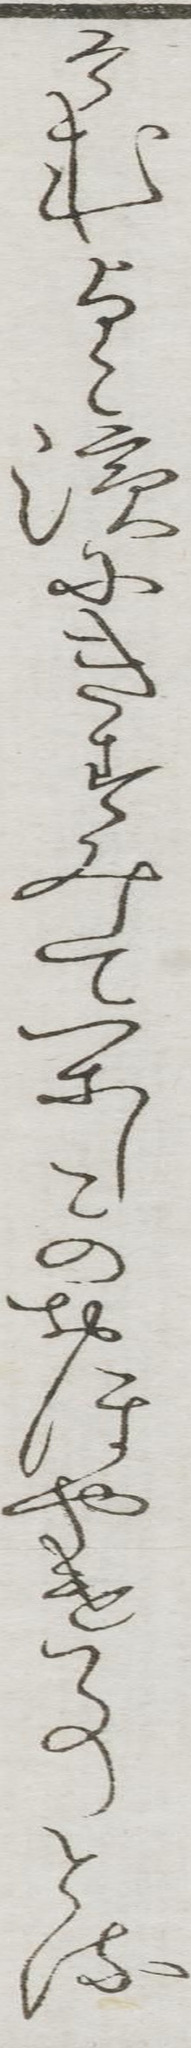けむよと濵にきすみてかしこのおほやけ事とる

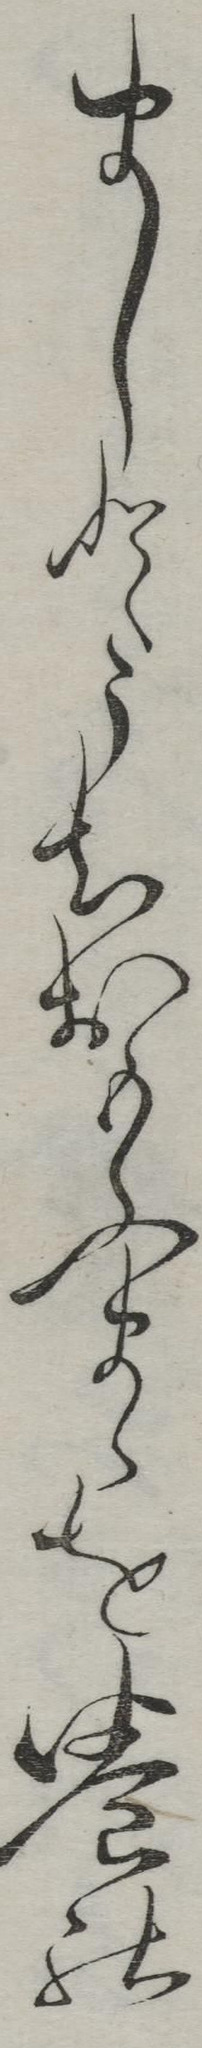ましとうちおもふまゝを巻の
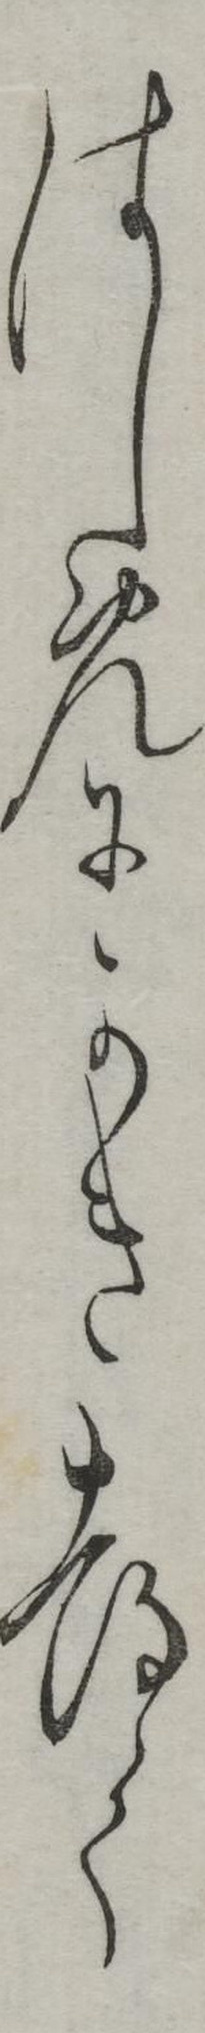はしめにかきつく
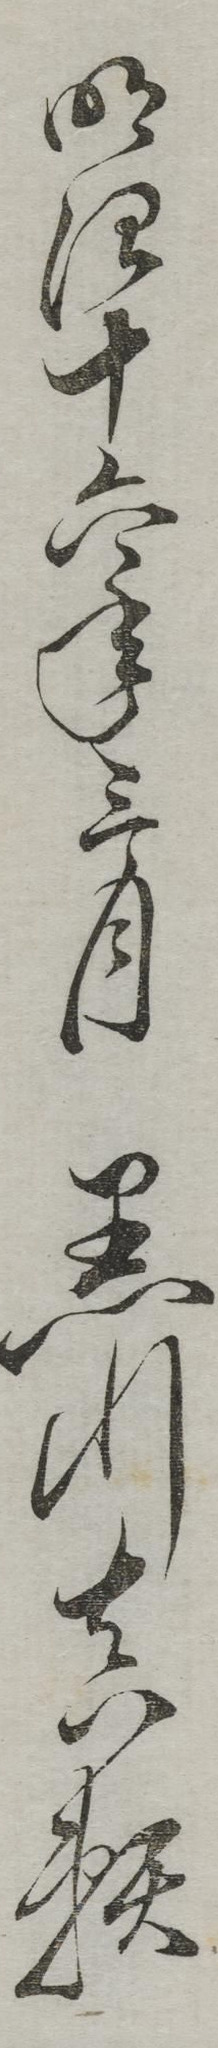明治十六年三月黒川真頼
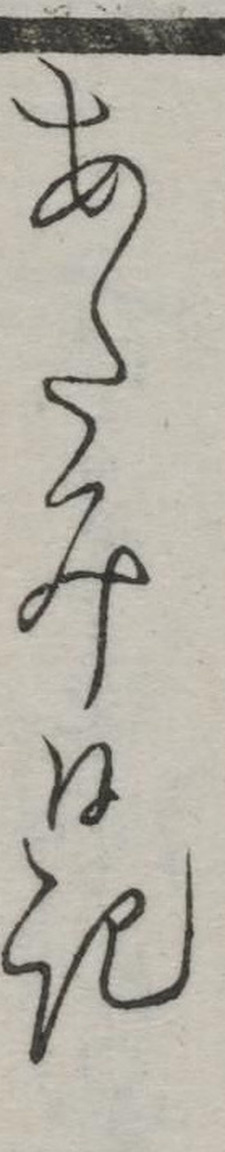あたみ日記
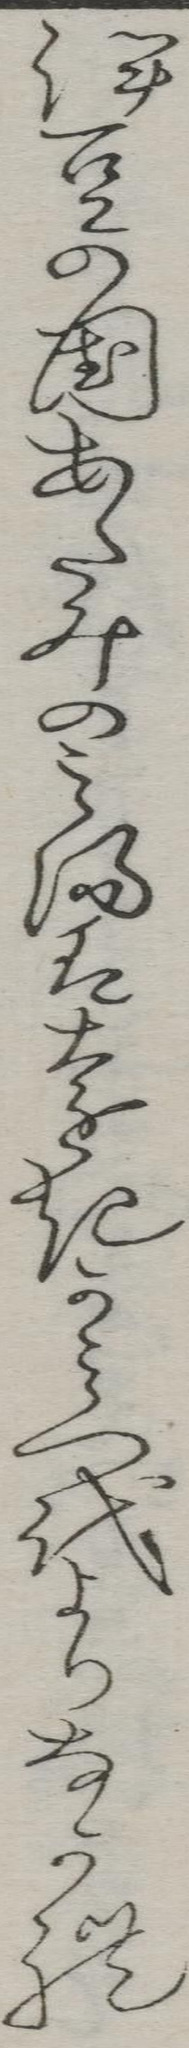伊豆の国あたみのみ湯はたをきかみつ代よりなかれ
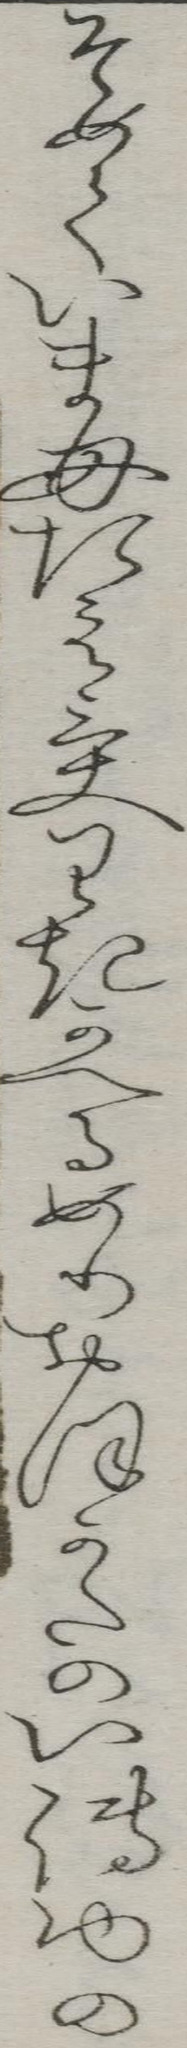そめていまもたえすわきかへるめりおほかたのいてゆの
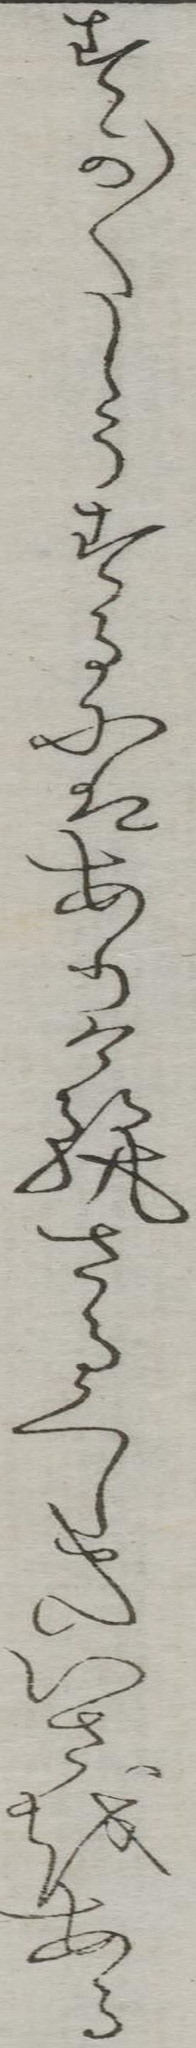すか〳〵しうするにはありけれさるくしきいさをある
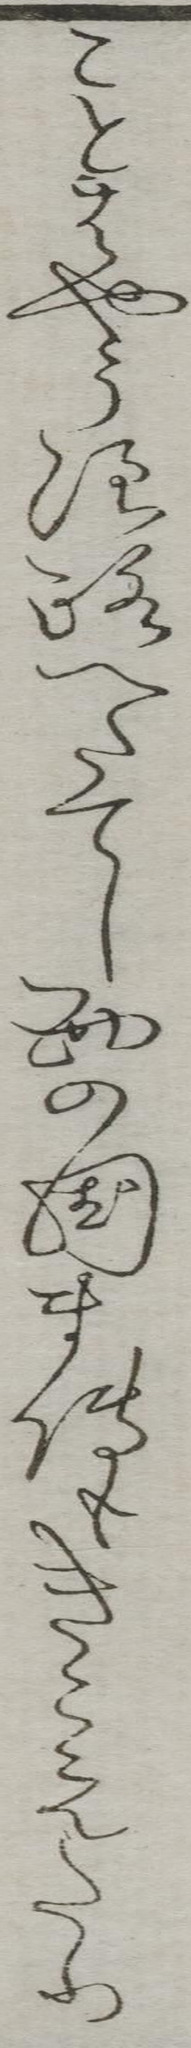ことはやう浪路へたてし西の国まてもきこえたり
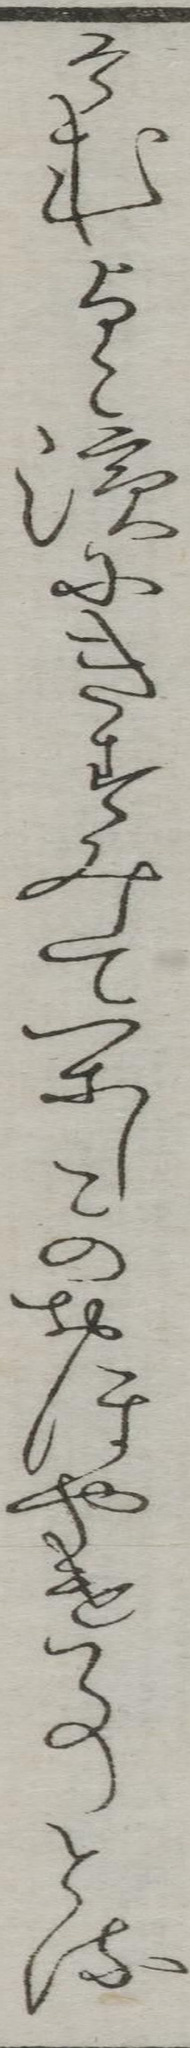けむよと浜にきすみてかしこのおほやけ事とる

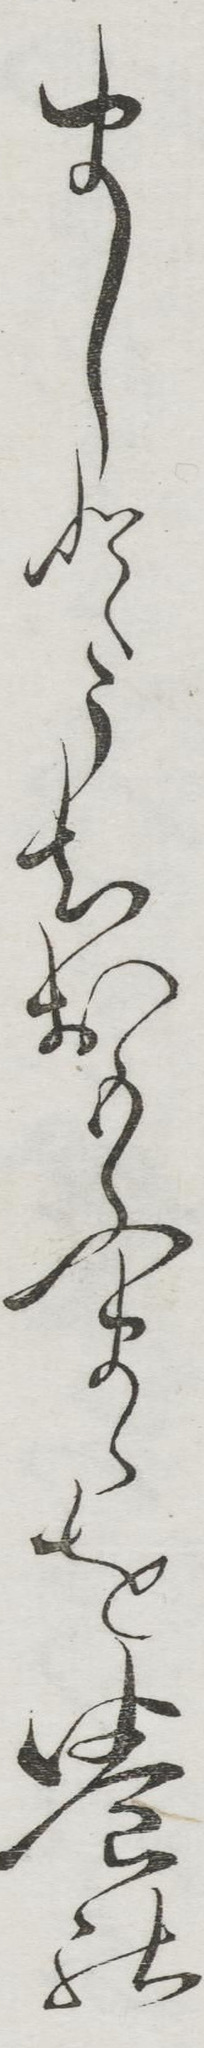ましとうちおもふまゝを巻の
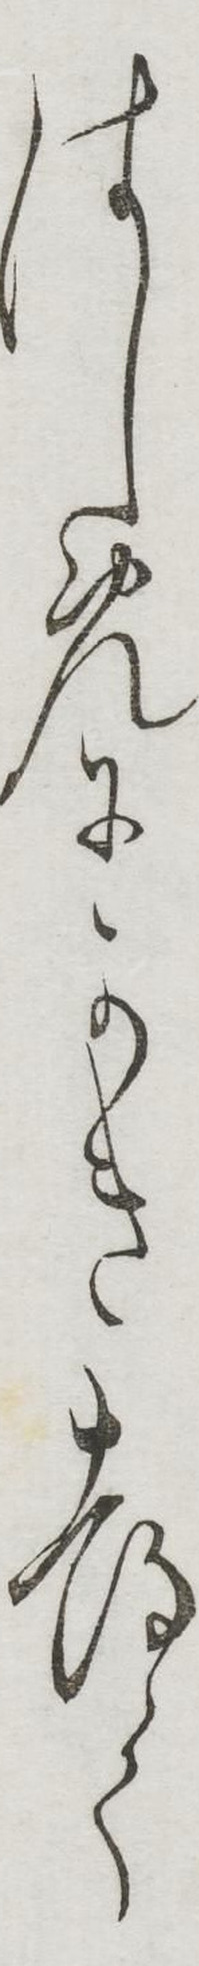はしめにかきつく
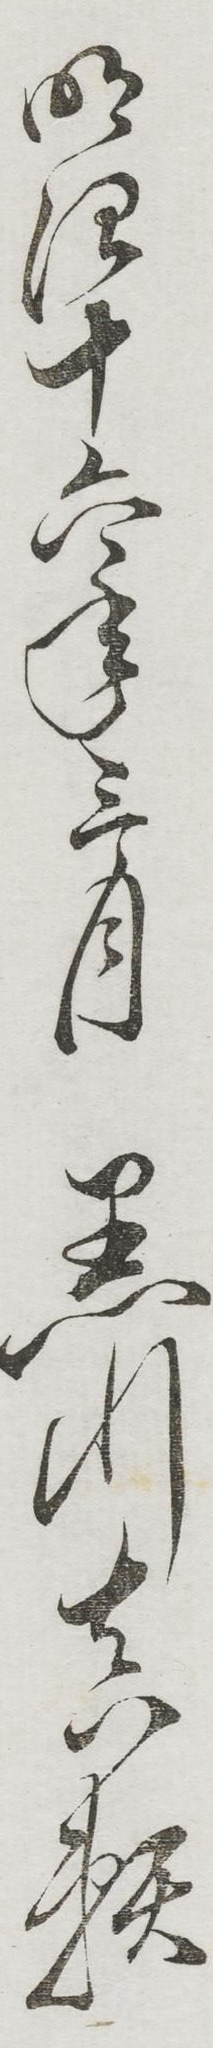明治十六年三月黒川真頼
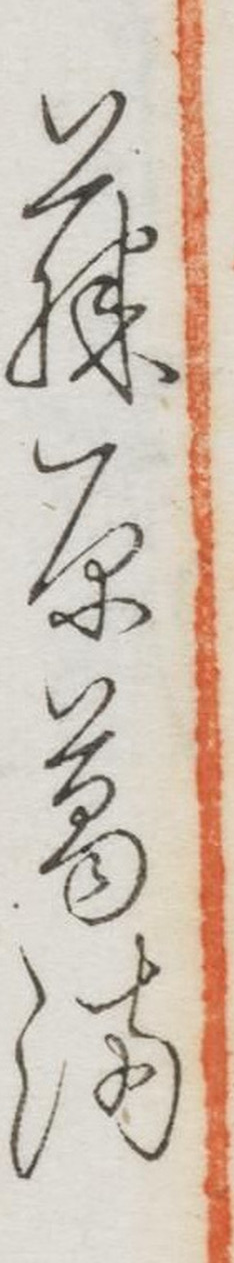藤原葛満
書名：挿画熱海日記　全
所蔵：東京大学地震研究所図書室 Earthquake Research Institute Library, The University of Tokyo, JAPAN
